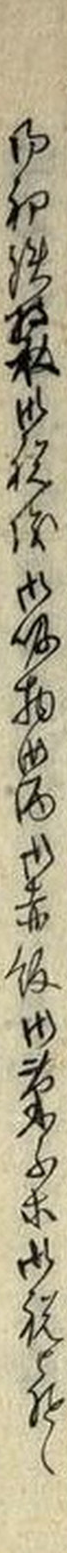御初鉄漿御祝儀御吸物御酒御赤飯御菓子等御祝被遊候
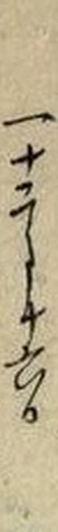一十二月十六日
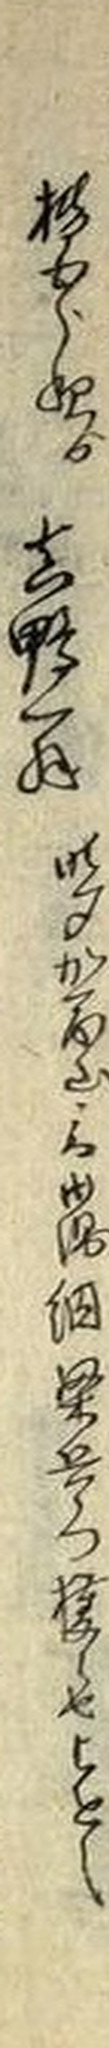揩五郎様ゟ真鴨一羽昨夕加茂山ニ而御側網梁兵右衛門獲候由被進之
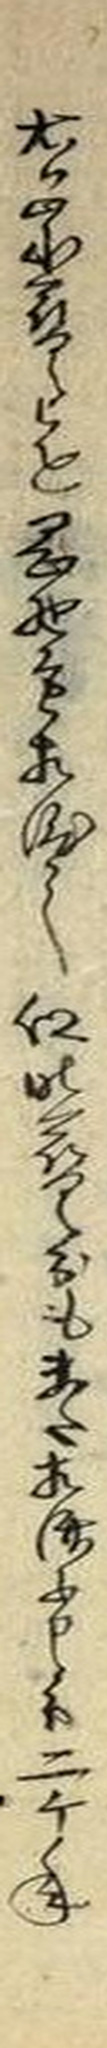右ハ歳暮之被進岡野方へ相渡之但昨暮之分も未た相済不申候付二ヶ年
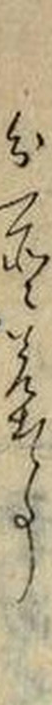分一所ニ差出候事
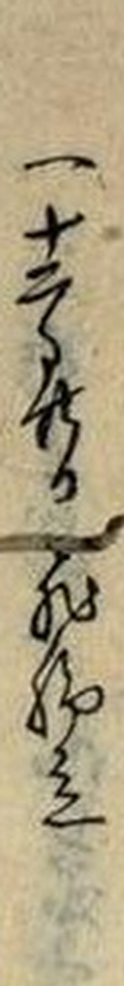一十二月廿日飛脚立
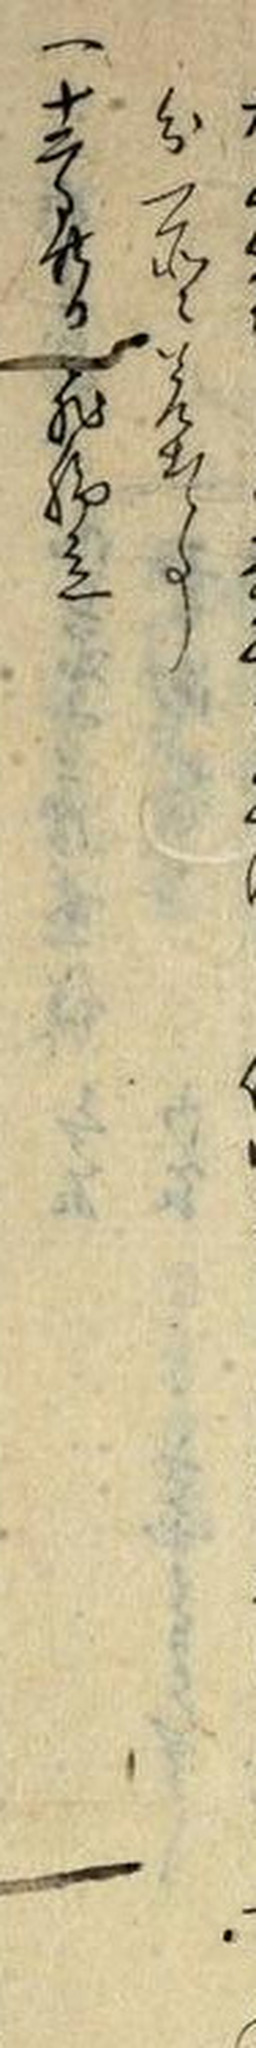一十二月廿日飛脚立

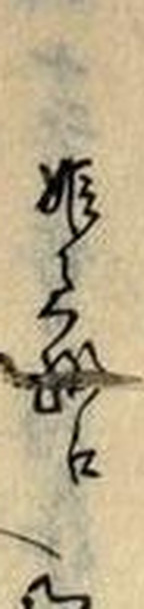姫君様江
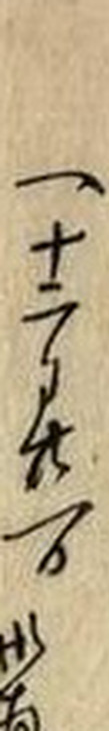一十二月廿一日
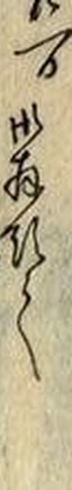御拝領之
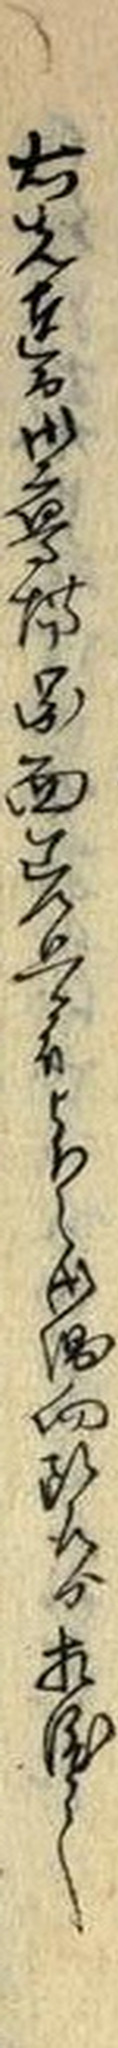右先達而御鷹場図面差上候ニ付被下之御側向頭取ゟ相渡之
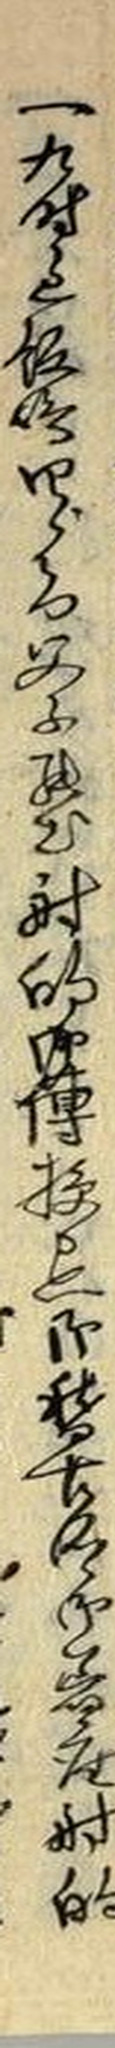一九時過飯嶋四郎右衛門父子罷出射的御伝授申上御稽古所へ御着座射的
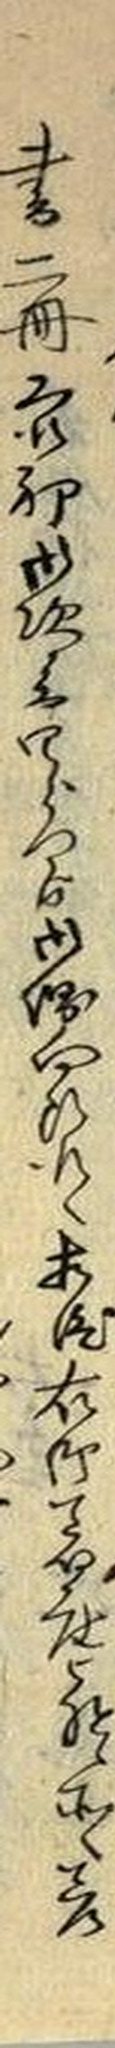書二冊最初御次ニ而四郎右衛門ゟ御側向頭取へ相渡右御着座被遊候所へ差
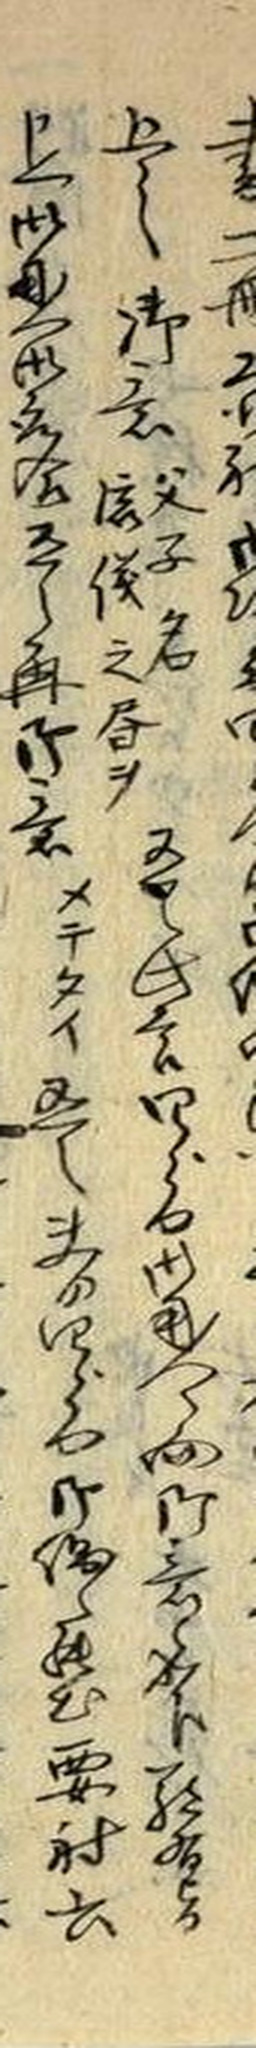申上御用人御取合有之再御意メテタイ有之夫ゟ四郎右衛門御側へ罷出要射六
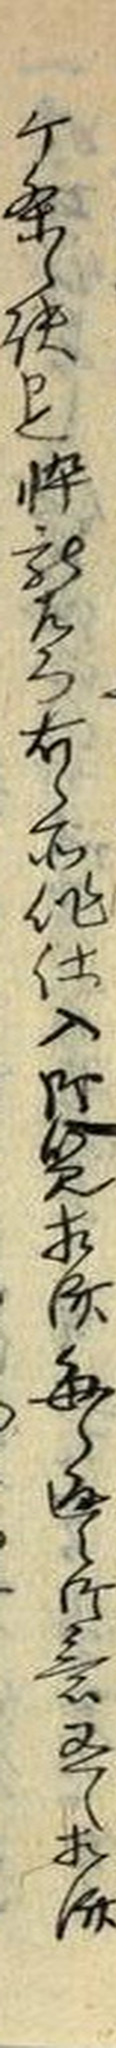ヶ条之訳申上忰新左衛門右之所作仕入御覧相済毎之通之御意有之相済
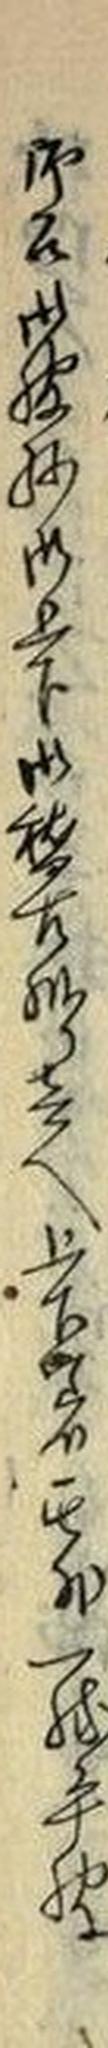御召御服紗御上下御稽古掛り壱人上下着其外一統平服
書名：少傅日録抄（斉承付側向頭取日記、在国）
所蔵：福井県文書館 Fukui Prefectural Archives
